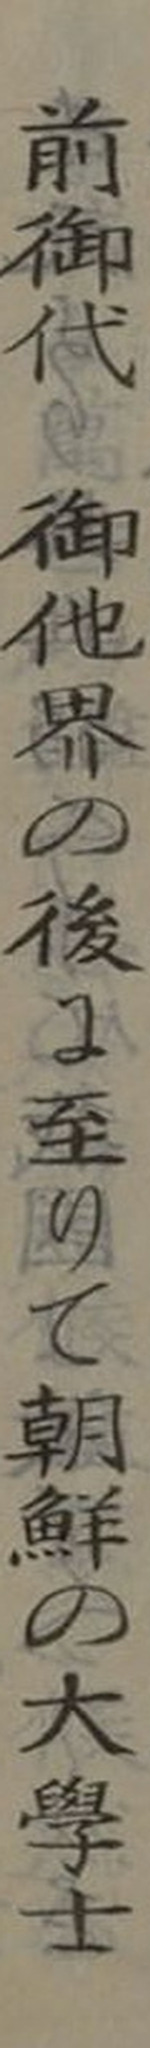前御代御他界の後に至りて朝鮮の大學士
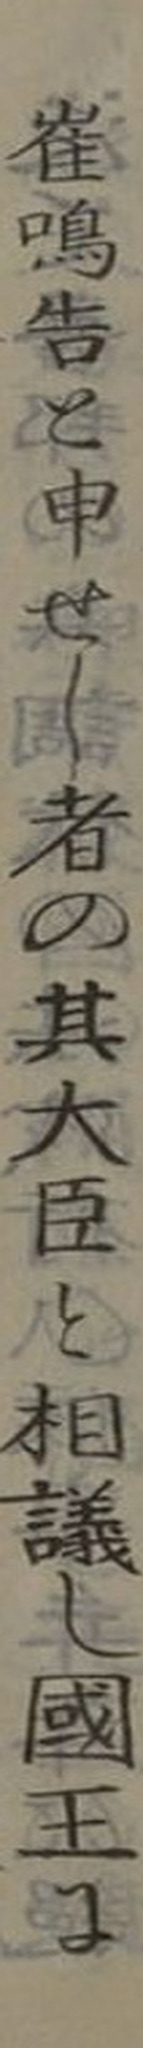崔鳴告と申せし者の其大臣と相議し國王に
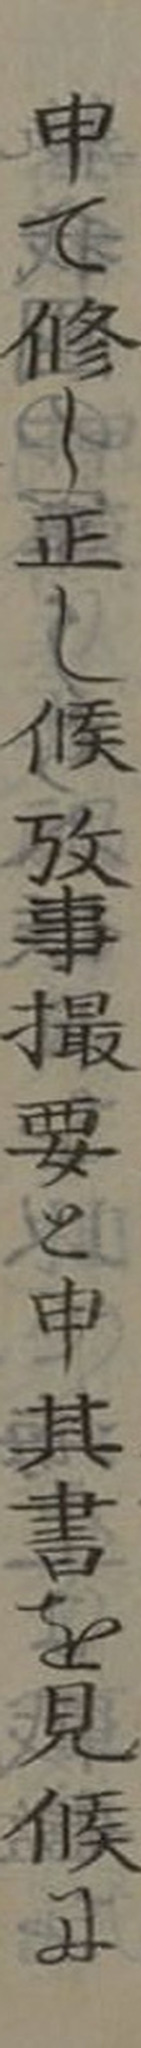申て修し正し候攷事撮要と申其書を見候に
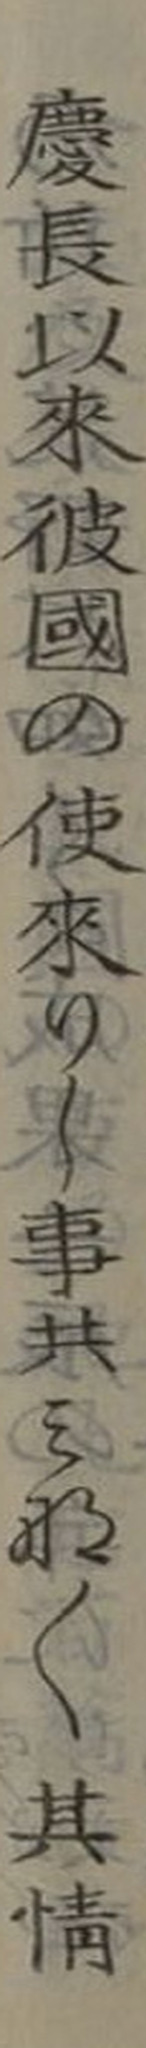慶長以來彼國の使來りし事共みな〳〵其情
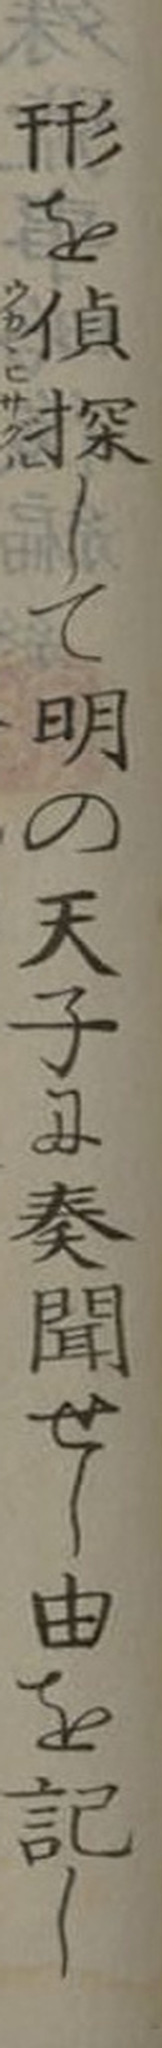形を偵探して明の天子に奏聞せし由を記し
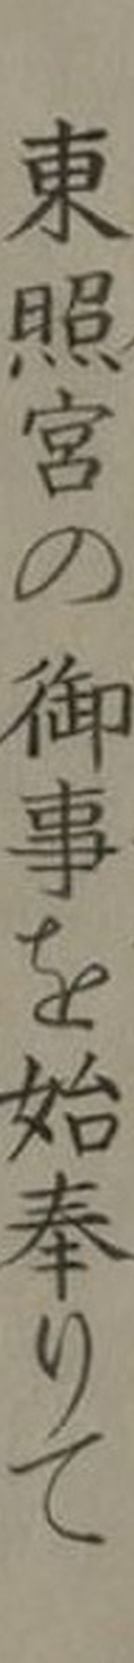東照宮の御事始奉りて
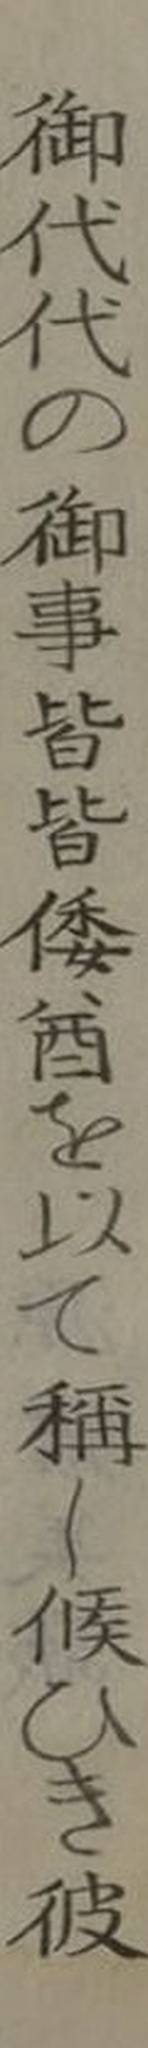御代代の御事皆皆倭酋を以て稱し候ひき彼
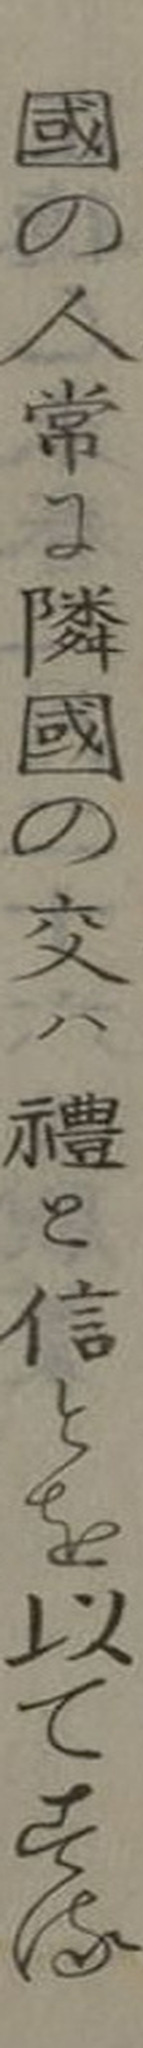國の人常に隣國の交は禮と信とを以てする
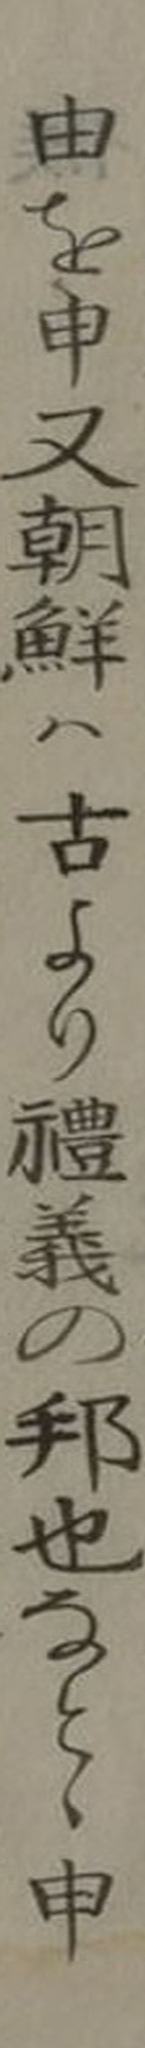由を申又朝鮮は古より禮義の邦也なとゝ申
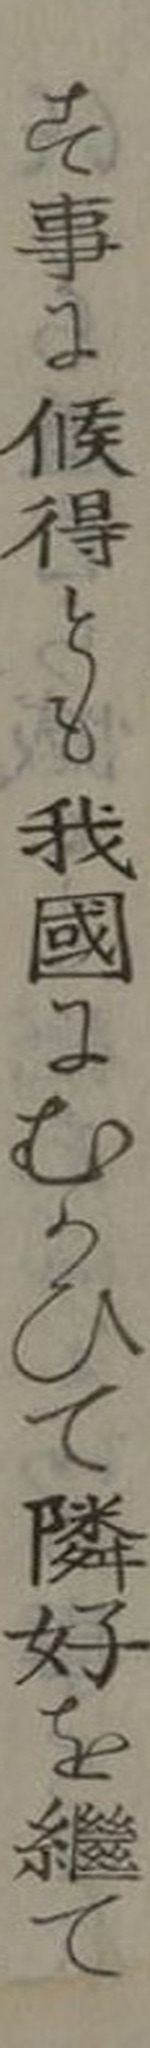そ事に候得とも我國にひかひて隣好を繼て
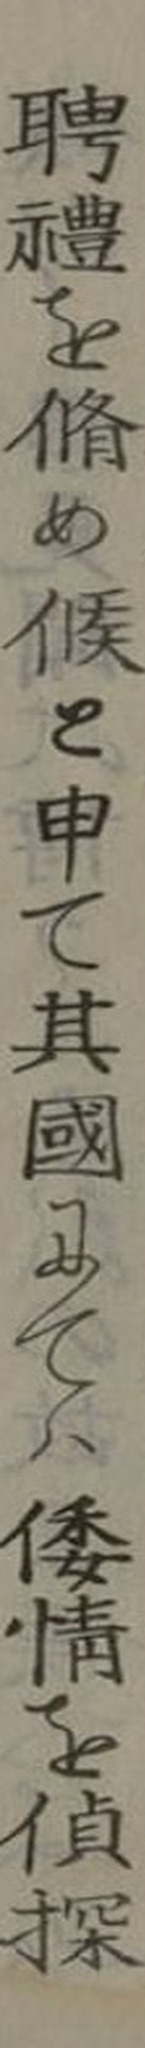聘禮を脩め候と申て其國にては倭情を偵探
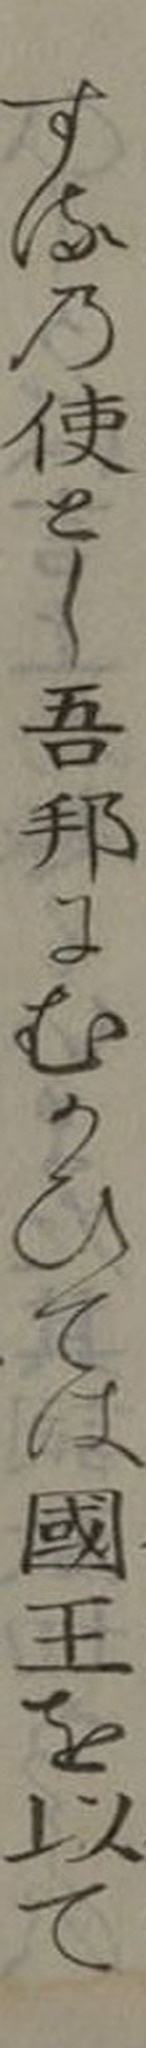するの使とし吾邦にむかひては國王を以て
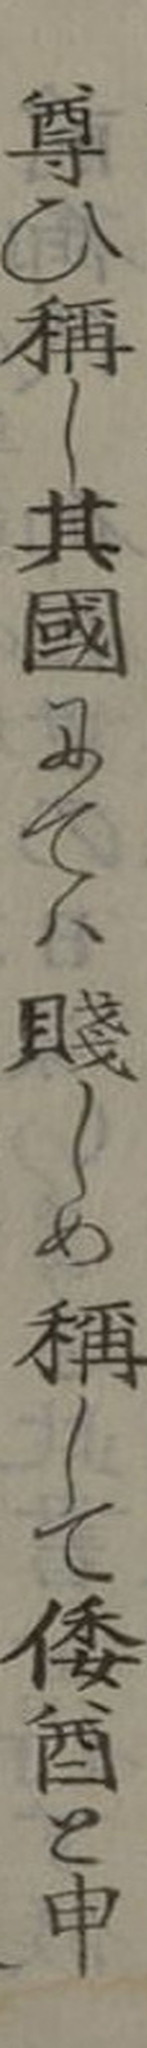尊ひ稱し其國にては賤しめ稱して倭酋と申
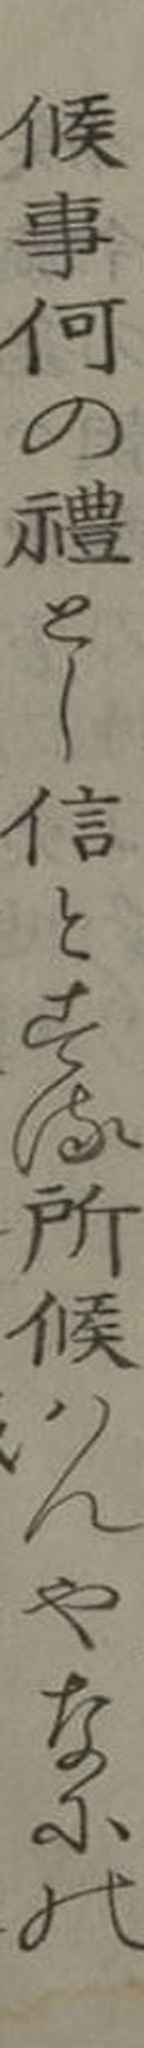候事何の禮とし信とする所候はんやなにの
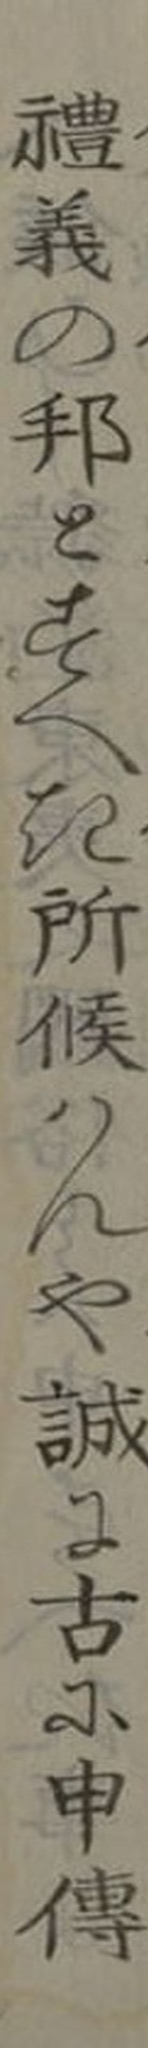禮義の邦とすへき所候はんや誠に古に申傳

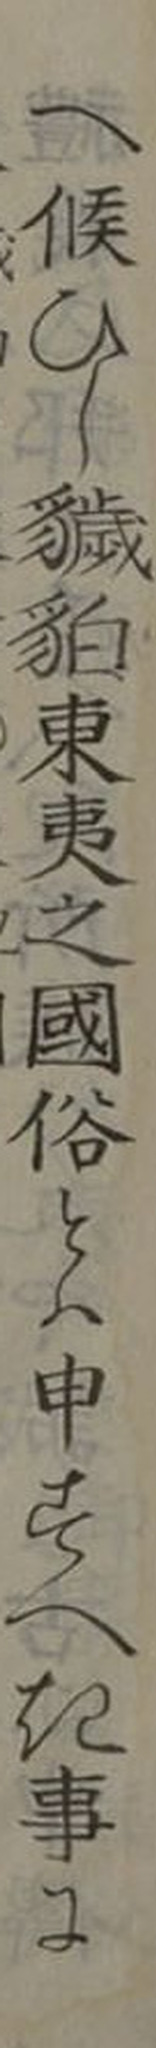へ候ひし貃東夷之國俗とは申すへき事に
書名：骨董録
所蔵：University of the Ryukyus Library
